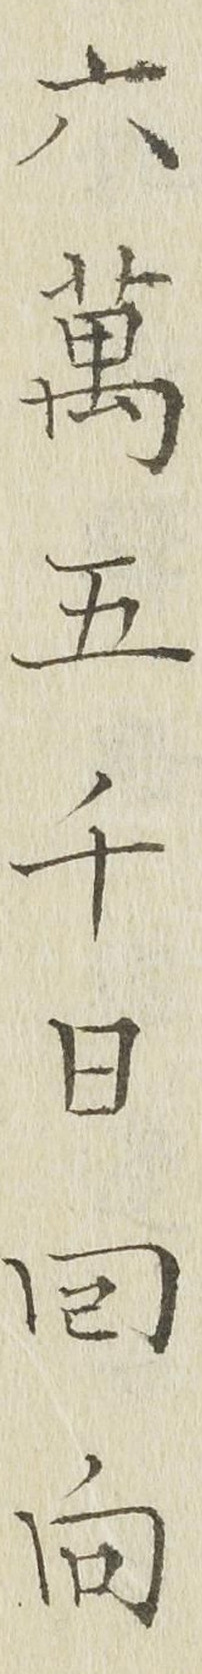六万五千日回向
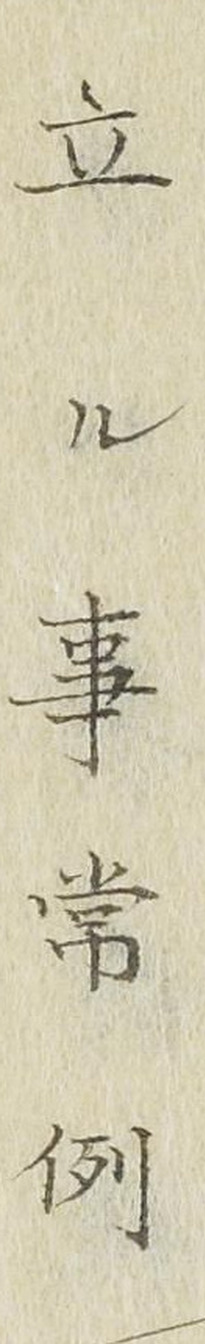立ル事常例
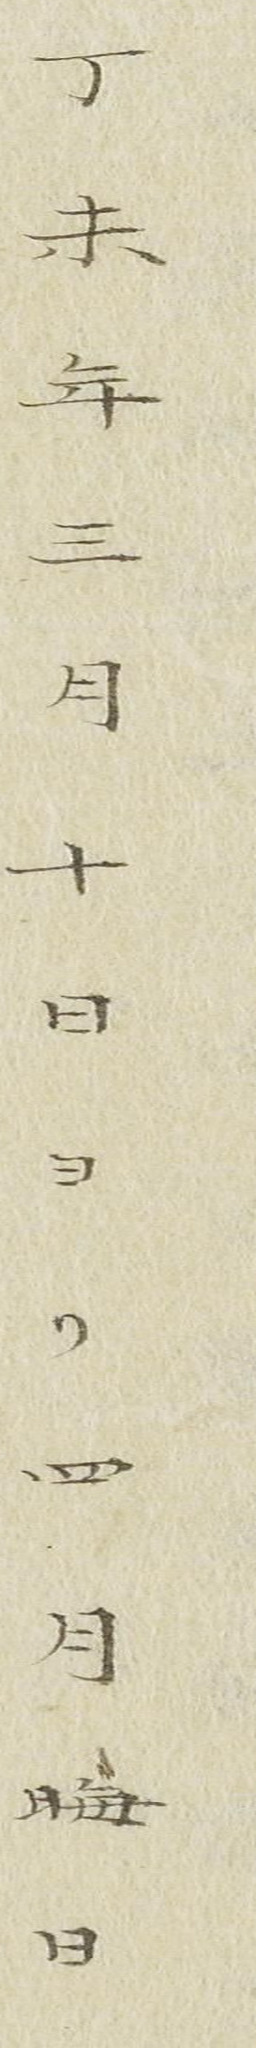丁未年三月十日ヨリ四月晦日
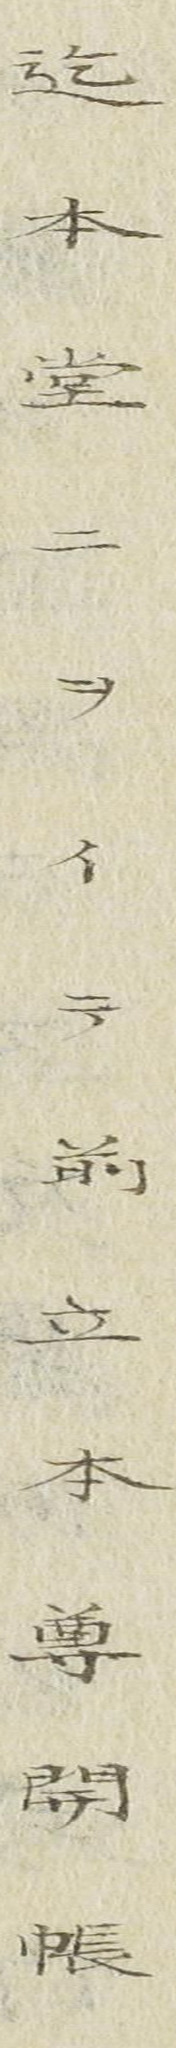迄本堂ニヲイテ前立本尊開帳
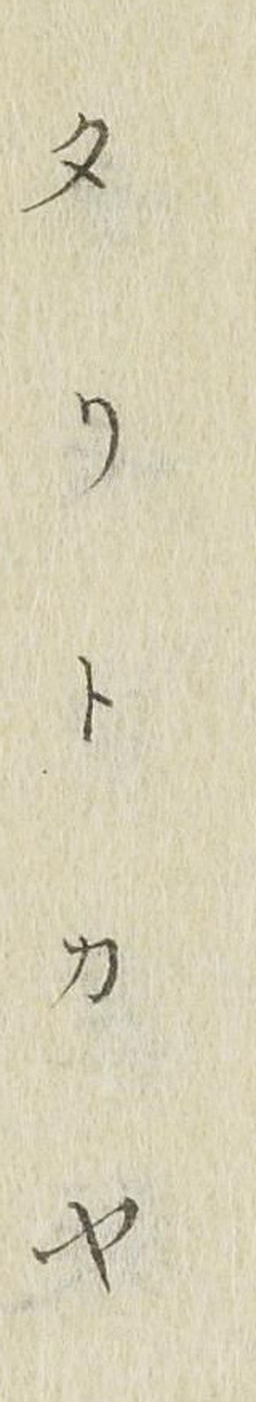タリトカヤ
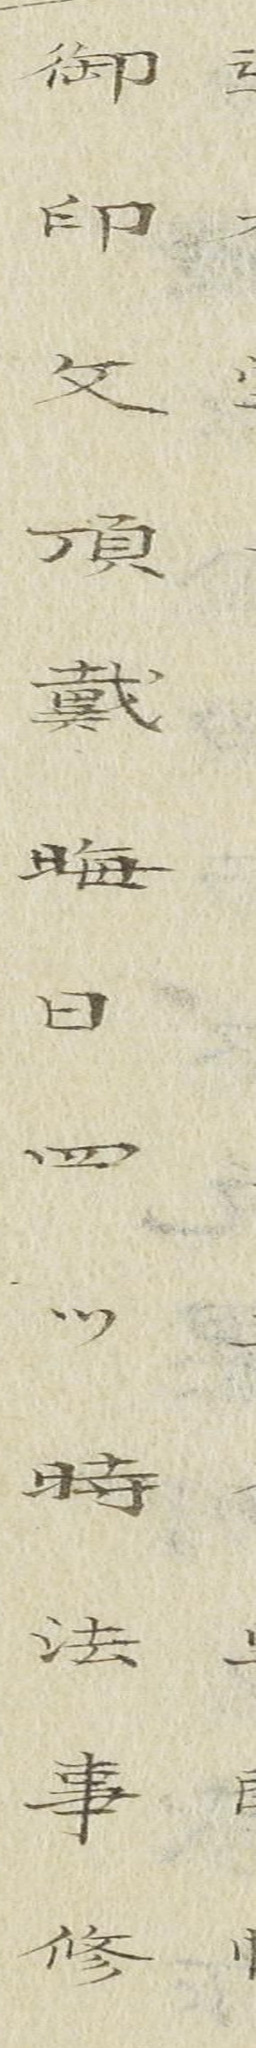御印文頂戴晦日四ツ時法事修
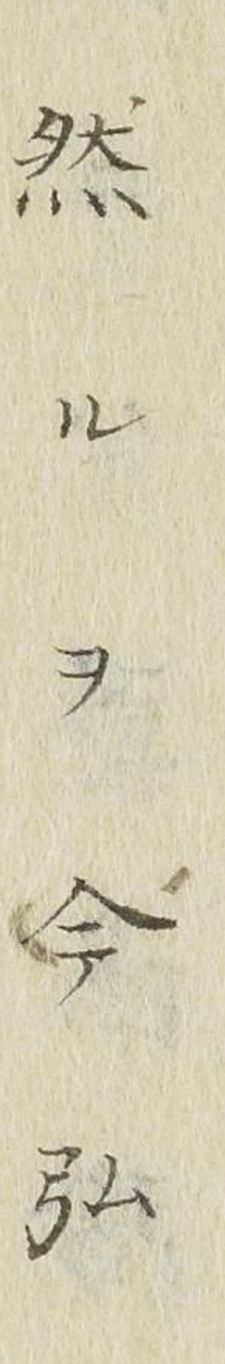然ルヲ今弘
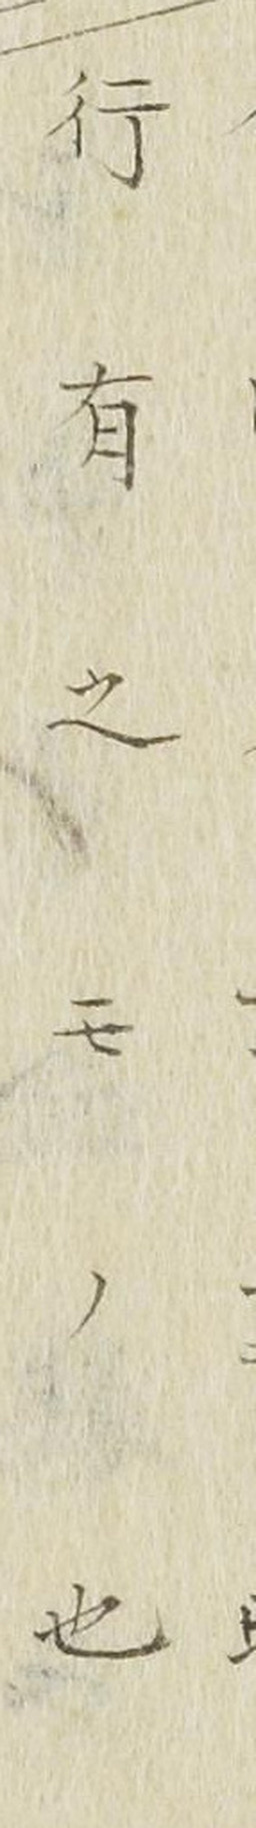行有之モノ也
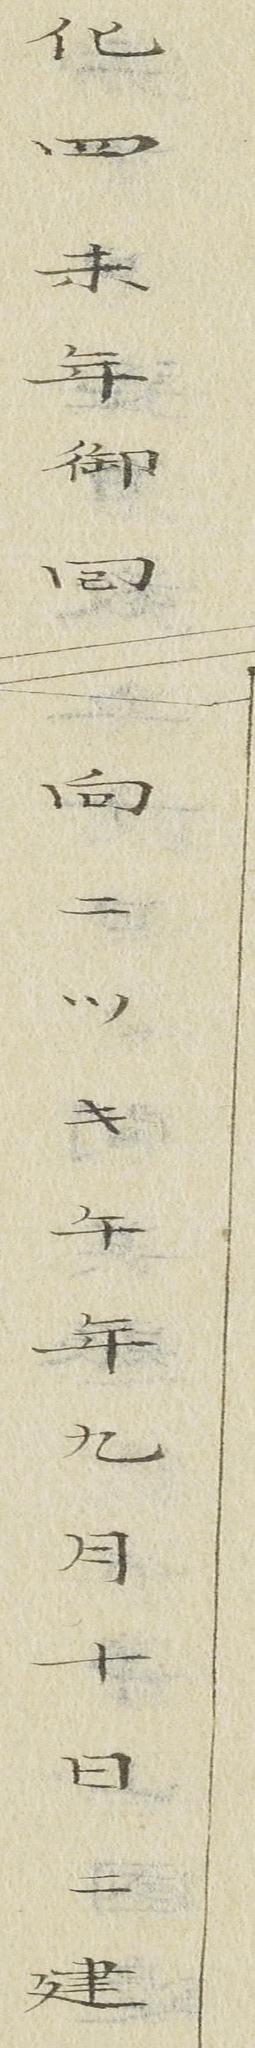化四未年御回向ニツキ午年九月十日ニ建
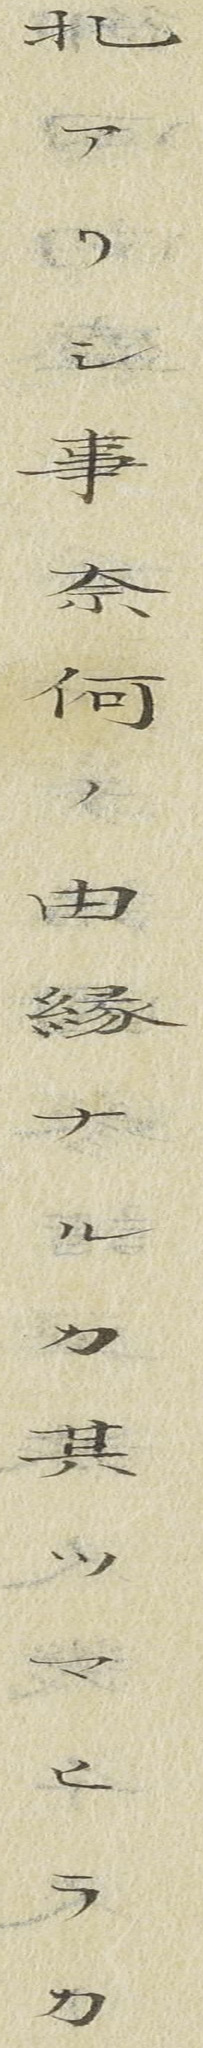札アリシ事奈何ノ由縁ナルカ其ツマヒラカ
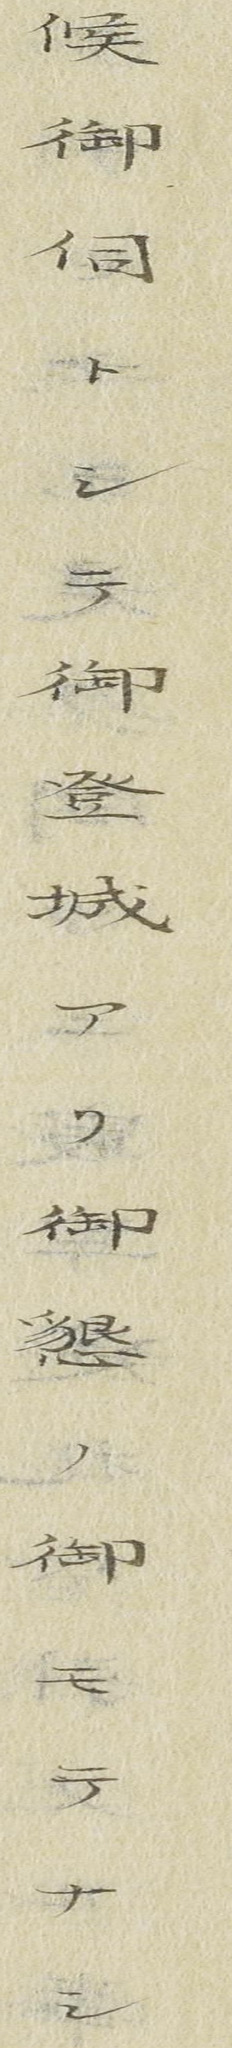候御伺トシテ御登城アリ御懇ノ御モテナシ
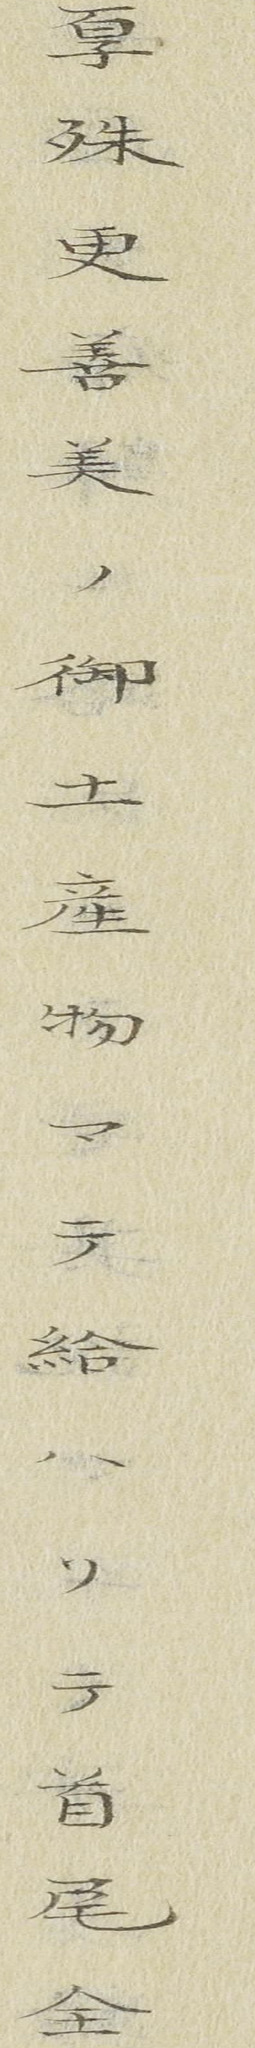厚殊更善美ノ御土産物マテ給ハリテ首尾全
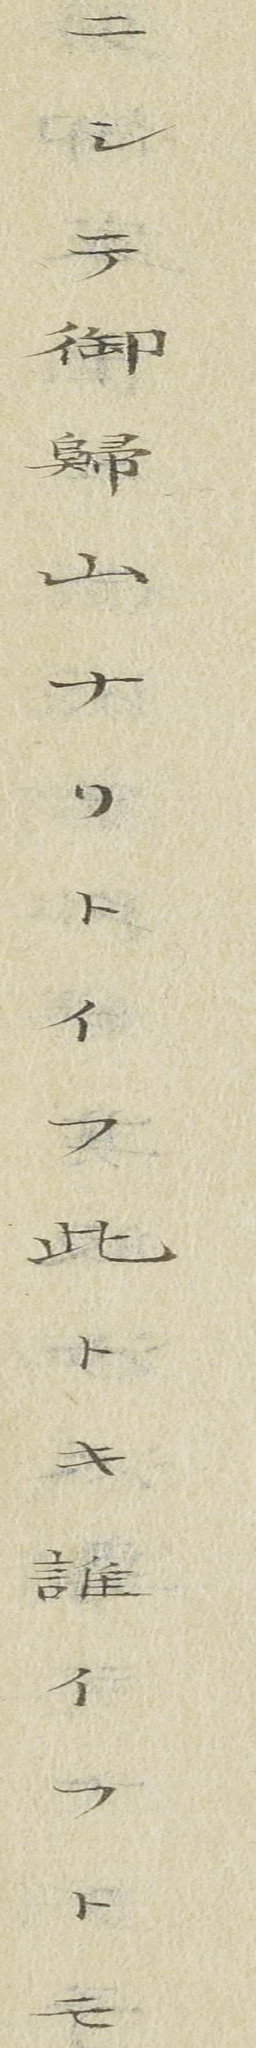ニシテ御帰山ナリトイフ此トキ誰イフトモ
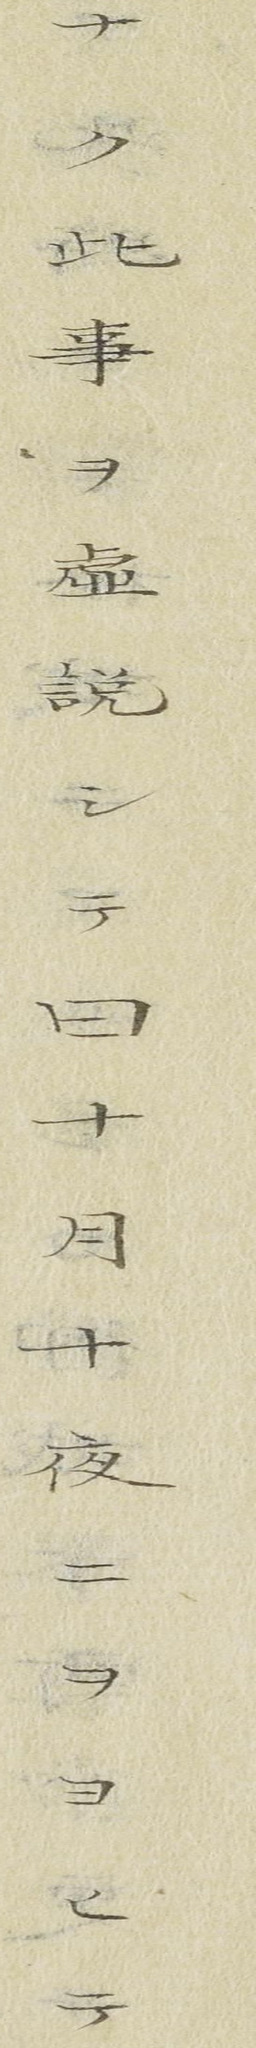ナク此事ヲ虚説シテ曰十月十夜ニヲヨヒテ
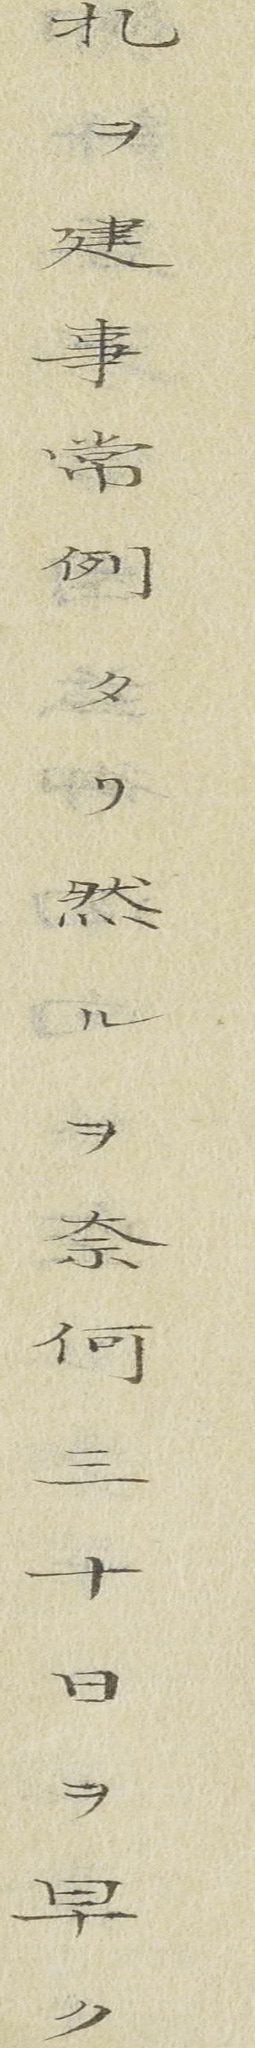札ヲ建事常例タリ然ルヲ奈何三十日ヲ早ク
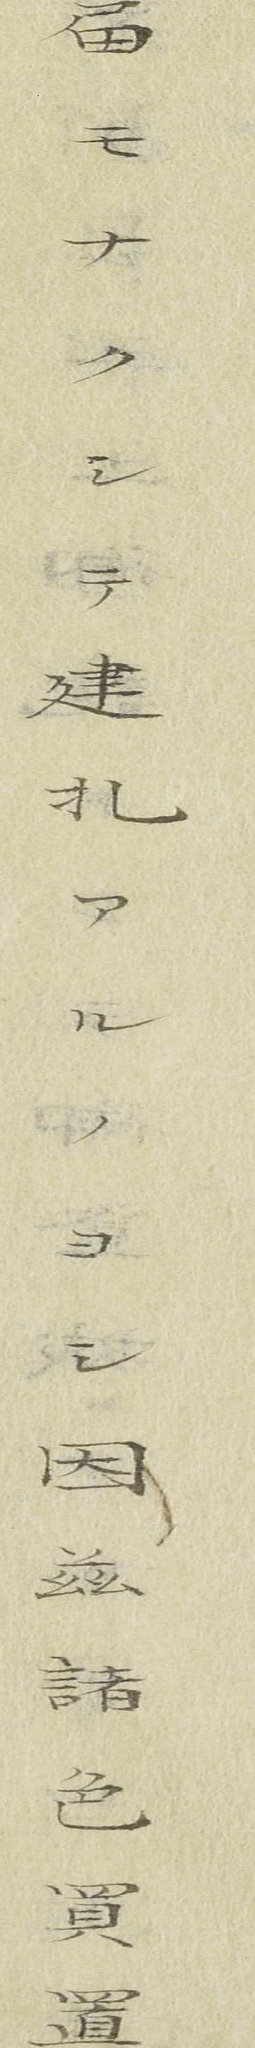届モナクシテ建札アルノヨシ因茲諸色買置
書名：地災撮要　地震之部　巻ノ二
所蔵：東京大学地震研究所図書室 Earthquake Research Institute Library, The University of Tokyo, JAPAN
